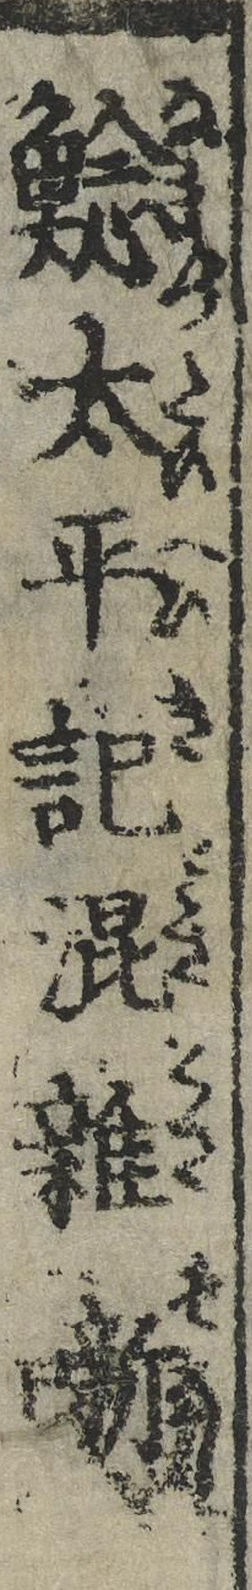鯰太平記混雑噺
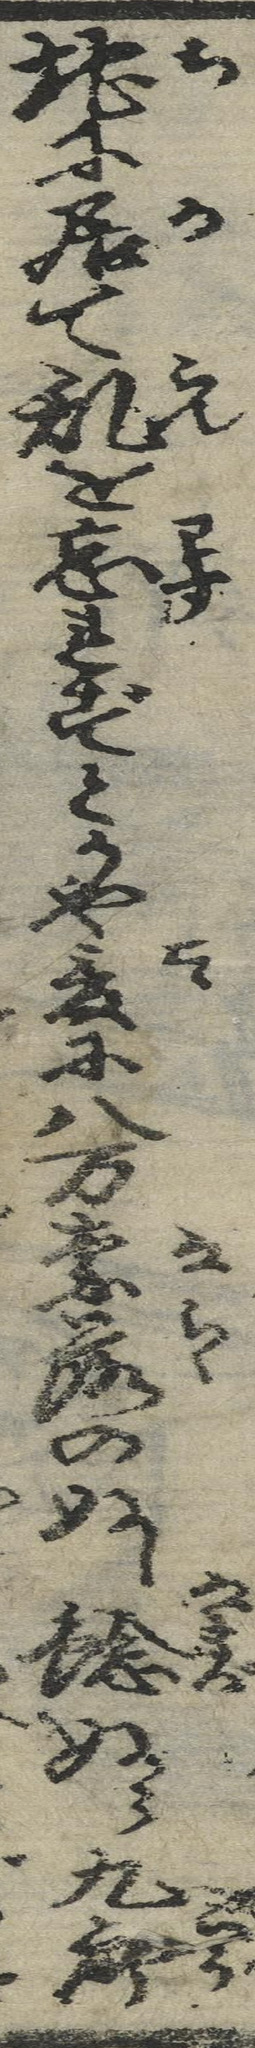地に居て乱を忘れずとうや爰に八万奈落のぬし鯰ぬら九郎
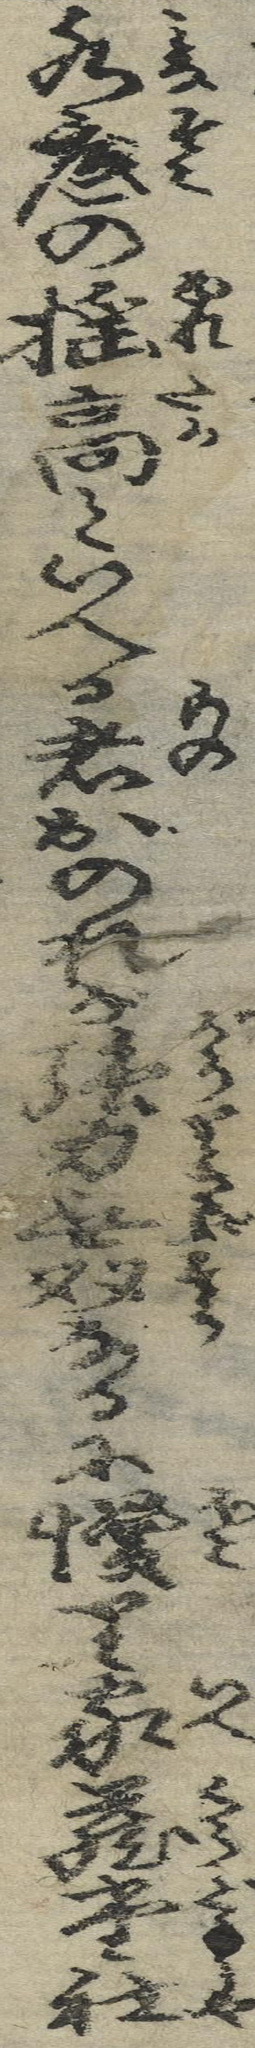水底の揺高といへる者おのれか強力無双なるに憍り家蔵堂社
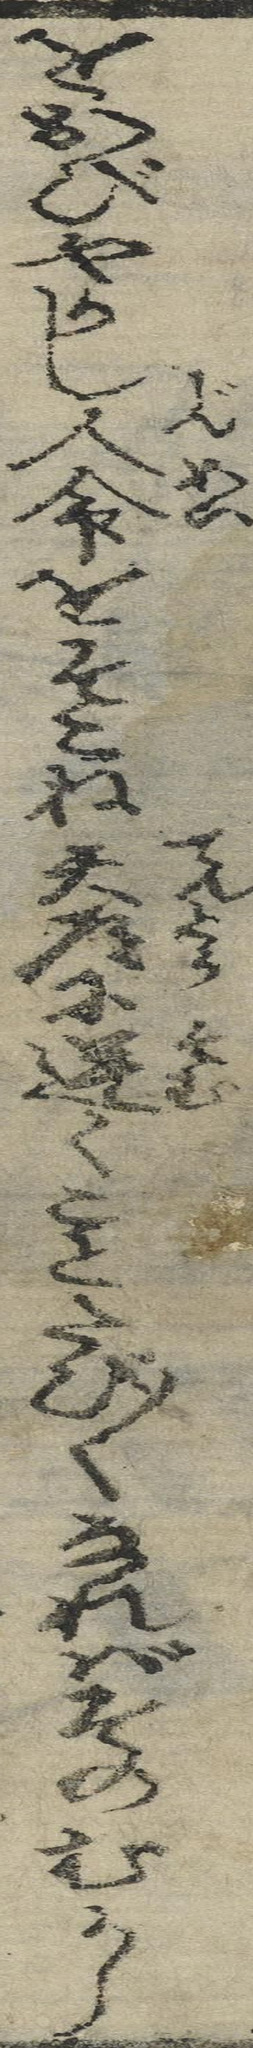をおびやかし人命をそこね天道に逆くことたび〳〵なればそのむかし
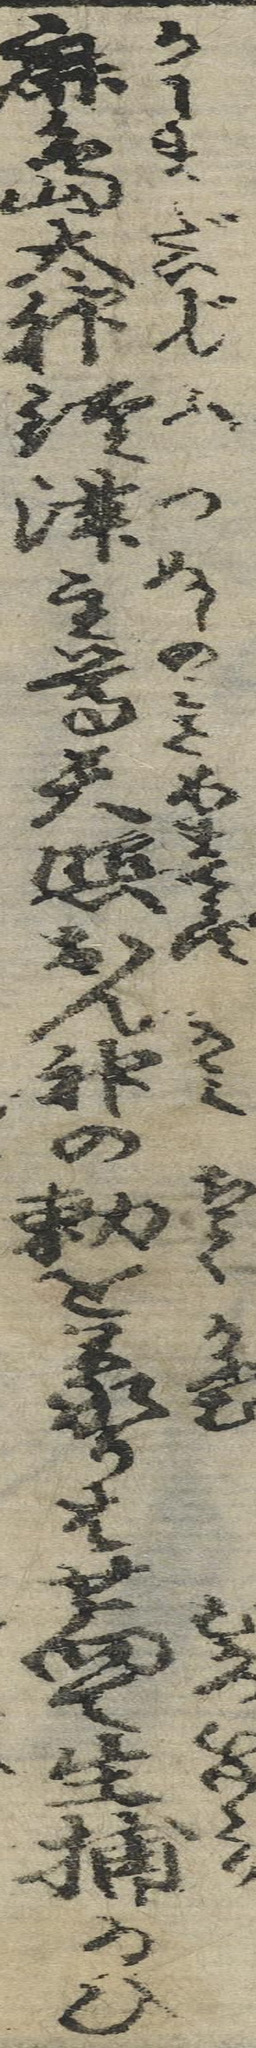鹿島太神経津主尊天照ほん神の勅を蒙りはせ向て生捕給ひ
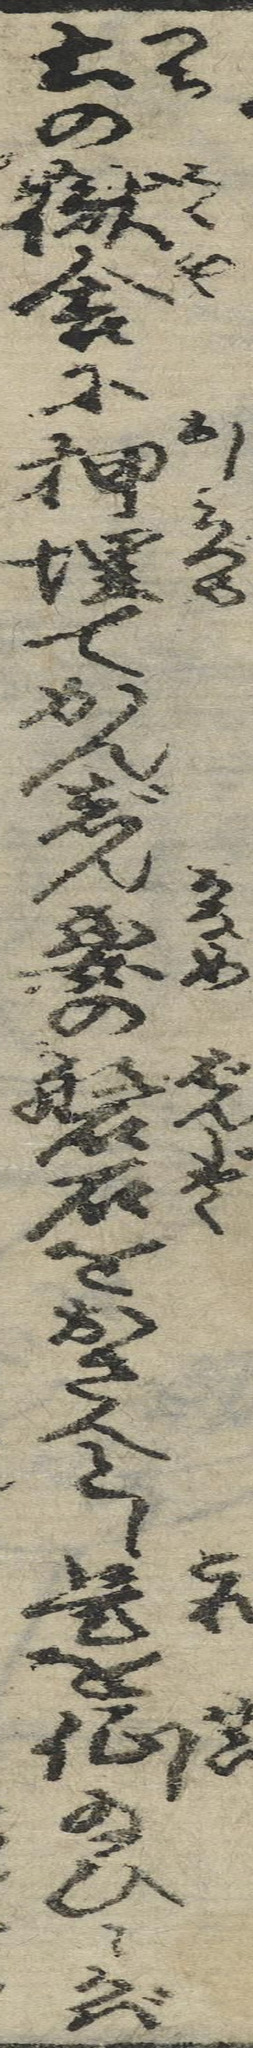土の獄舎に押埋てかんじん要の磐石をかきへとし是を征給い
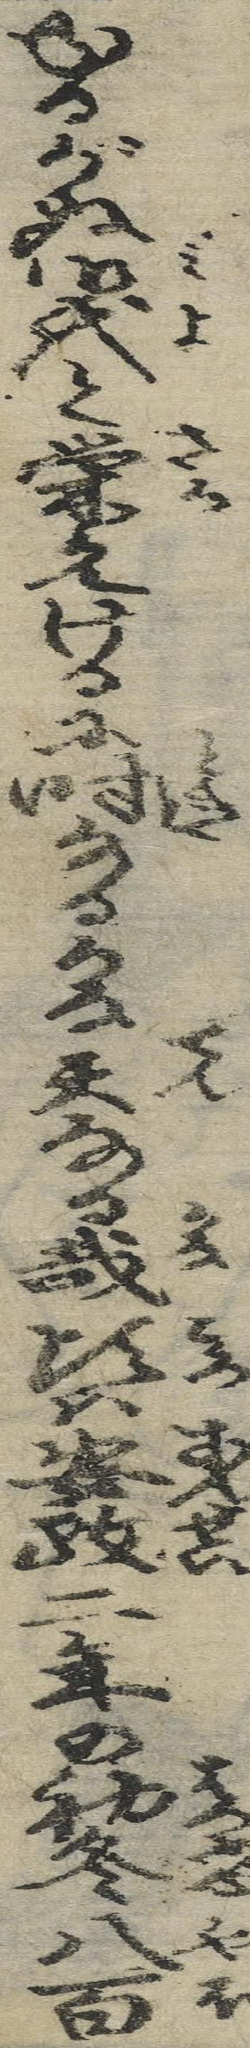ゆるがぬ御代と栄えけるに時給るかな天給る哉頃は安政二年の初冬八百
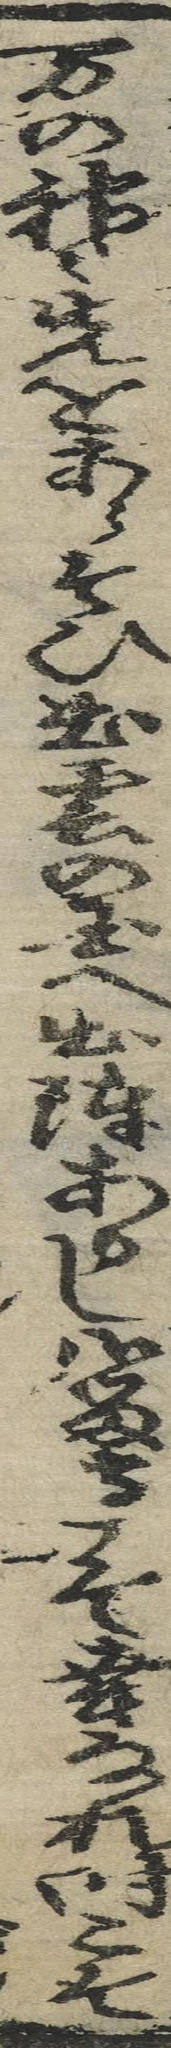万の神々先をあらそひ出雲の国へ出陣ありし御留守す幸なれ時こそ
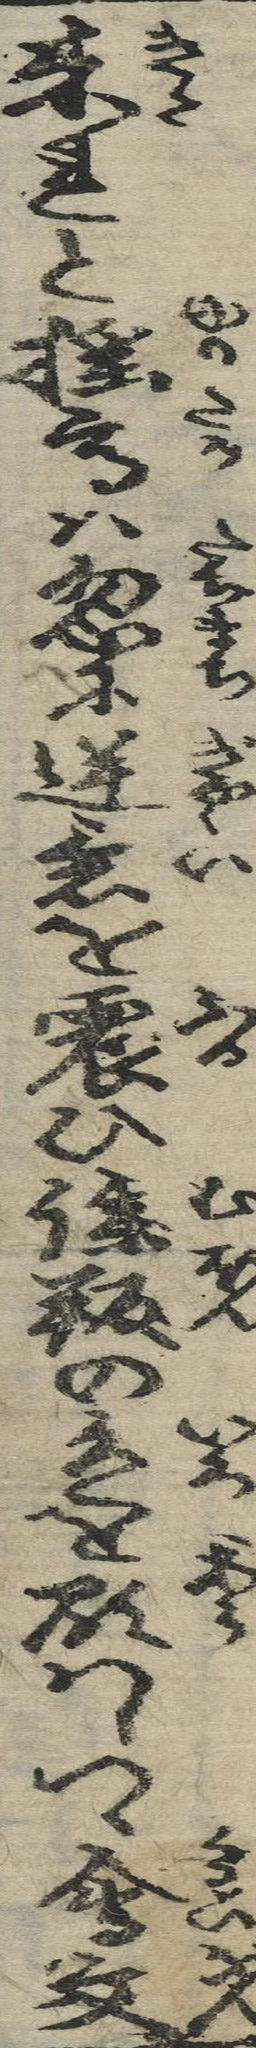来れと揺高は忽に逆意を震ひ謀叛の色を顕はしつヽ会文
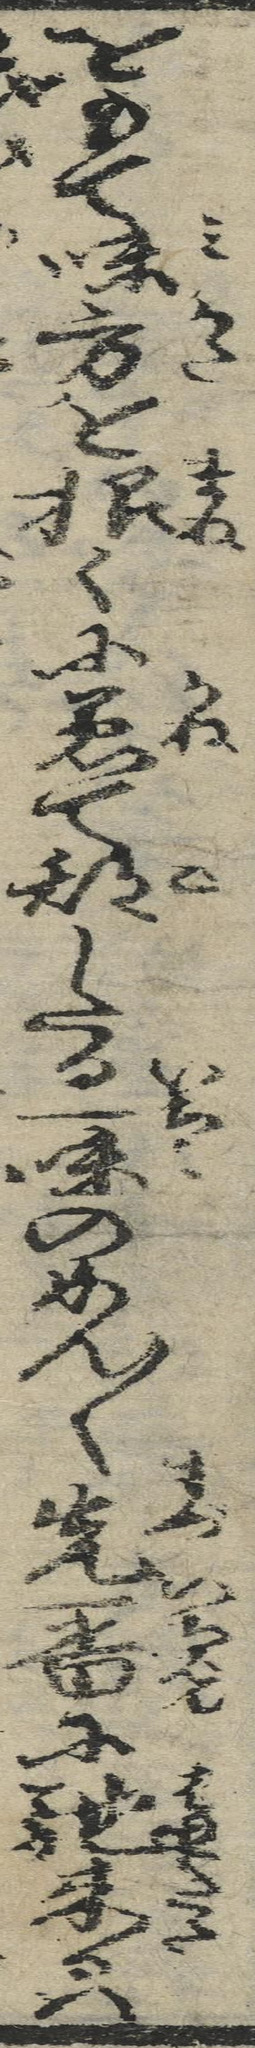をもて味方を招くに兼て都したる一味のめん〳〵先一番に馳来るは
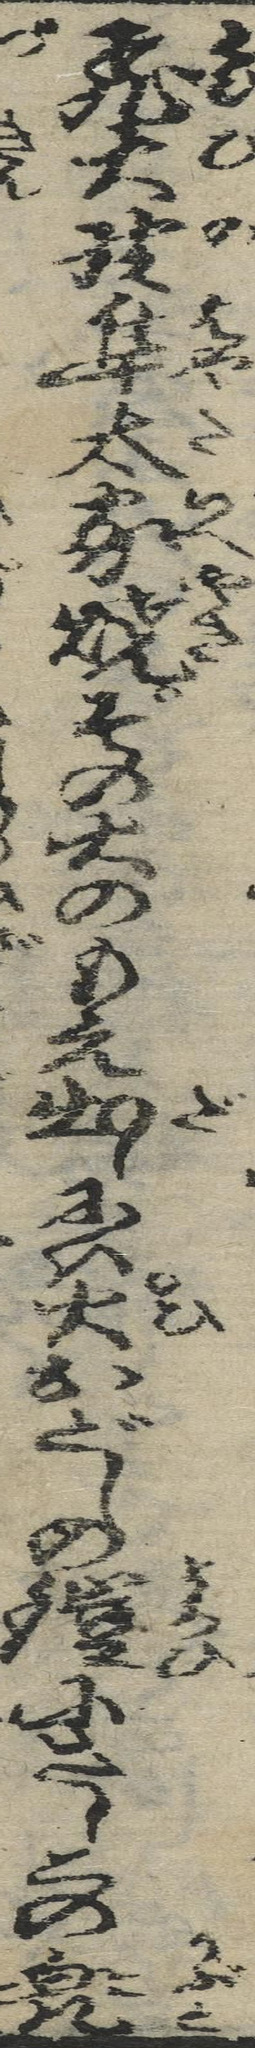飛火野隼太家焼。その火のもえ出しには。火おどしの鎧にさしこの兜
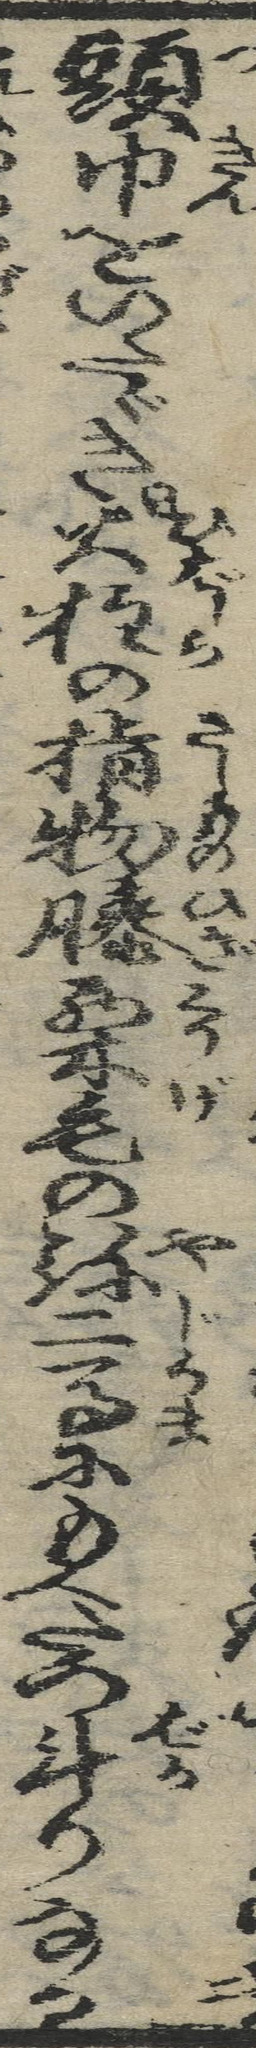頭巾をいたゞき。火鉢の指物膝栗毛の弥二馬にもへたつ斗りなる
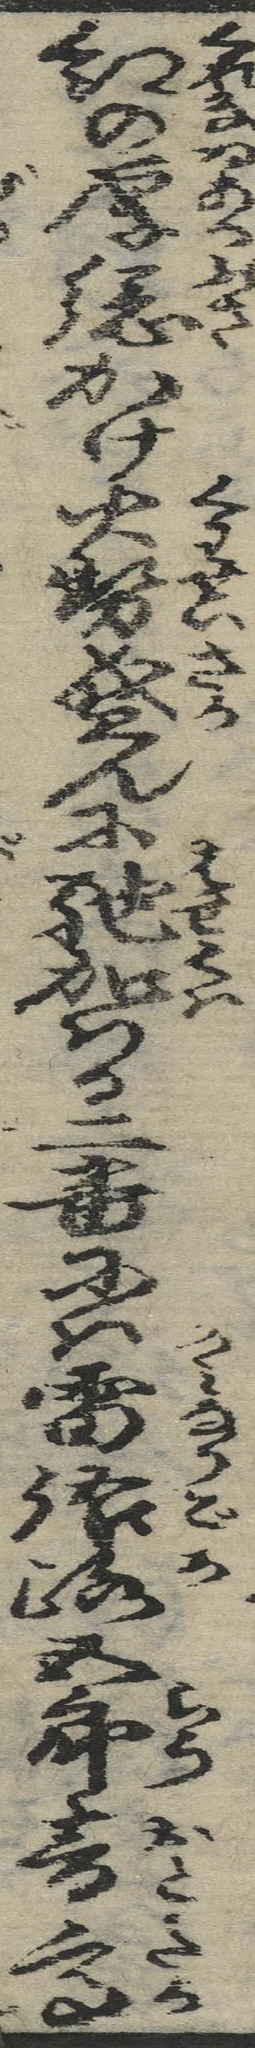紅の厚総かけ火勢盛んに馳加はる二番には雷語路五郎音高
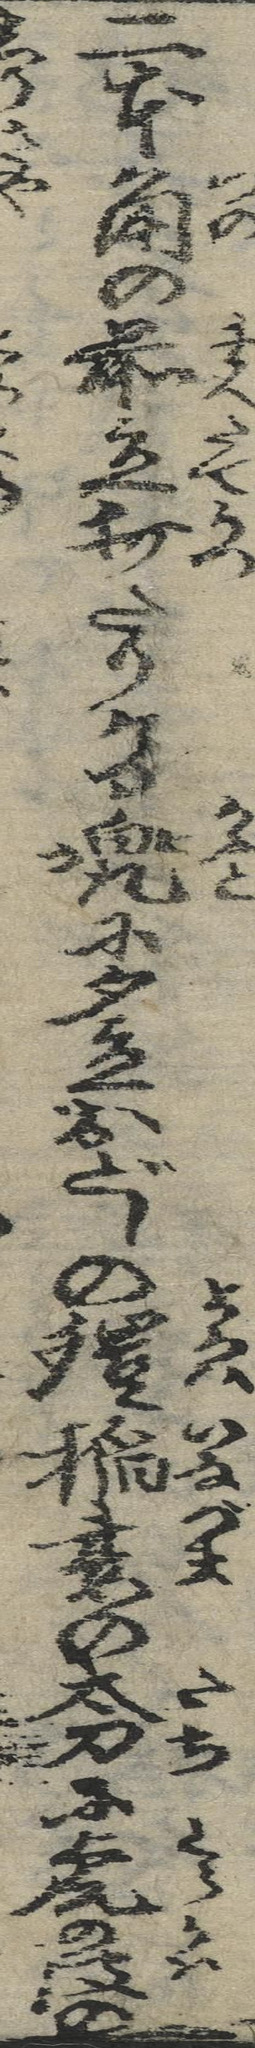二本角の前立打たりける兜に夕立おどしの鎧稲妻の太刀に虎の皮の
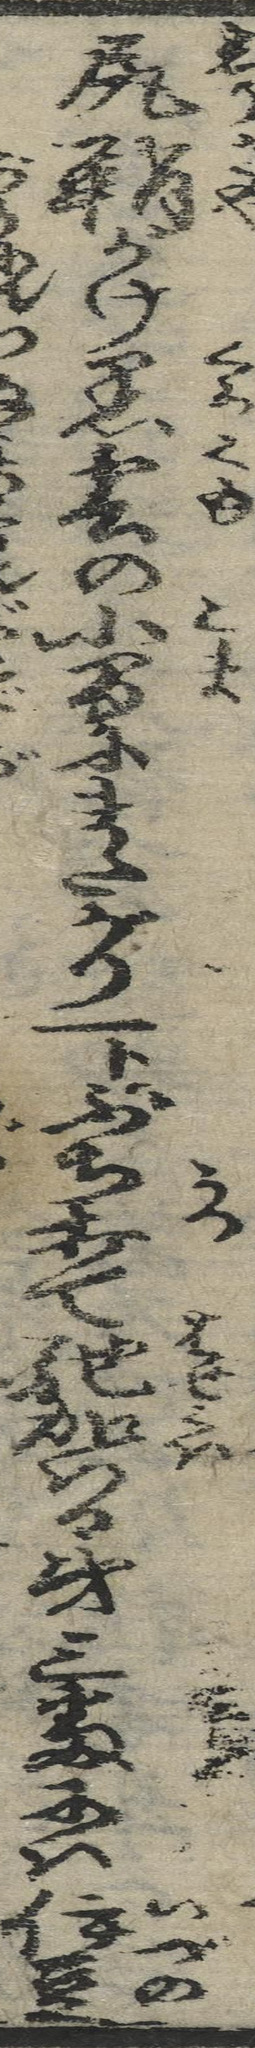尻鞘がけ黒雲の小間にまたがり下ぶち打て馳加はる第三当にハ伊豆
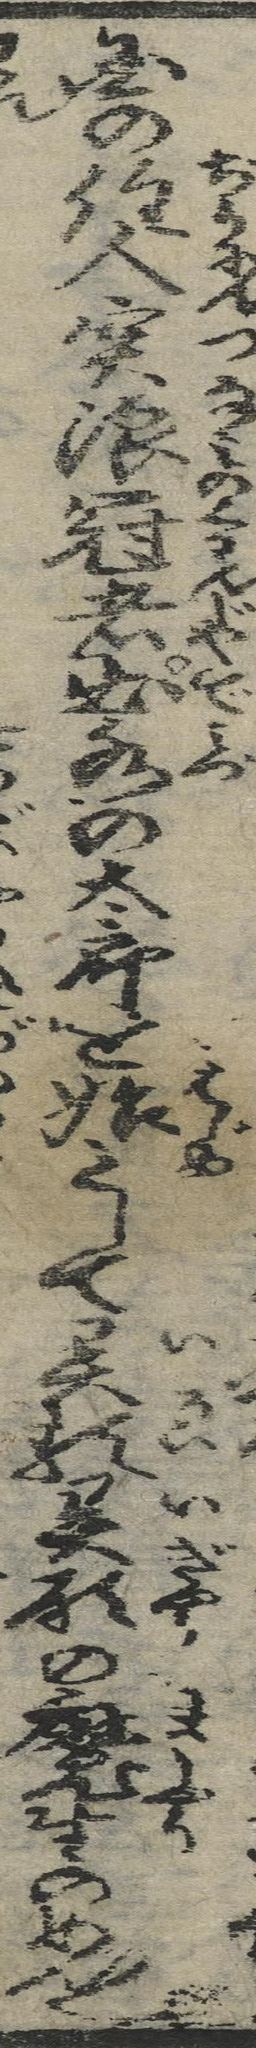国の住人突浪冠者。出水の太郎を始として異類異形の魔生のめん〳〵
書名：鯰太平記混雑ばなし
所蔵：東京大学地震研究所図書室 Earthquake Research Institute Library, The University of Tokyo, JAPAN
